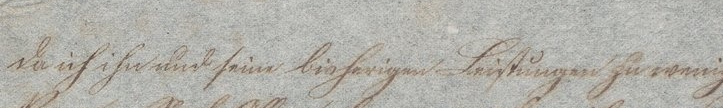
da ich ihn und seine bisherigen Leistungen zu wenig
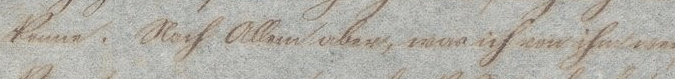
kenne. Nach Allem aber, was ich von ihm weiß,
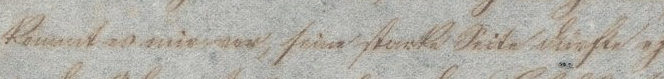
kommt es mir vor, seine starke Seite dürfte eher
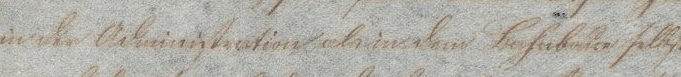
in der Administration als in dem Bahnbaue selbst
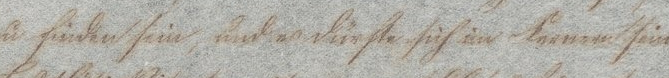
zu finden sein, und es dürfte sich im Fernern seine
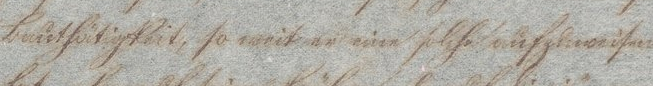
Bauthäthigkeit, so weit er eine solche aufzuweisen
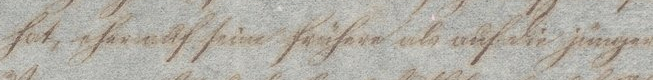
hat, eher auf seine frühere als auf die jüngere
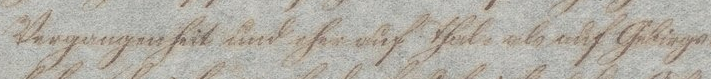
Vergangenheit und eher auf Thal- als auf Gebirgs-
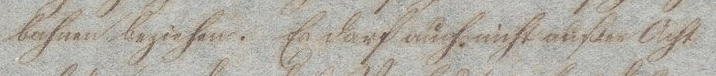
bahnen beziehen. Es darf auch nicht außer Acht
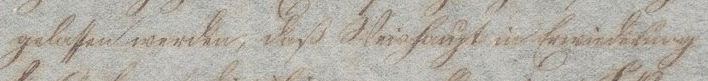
gelassen werden, daß Weishaupt in Erwiederung
